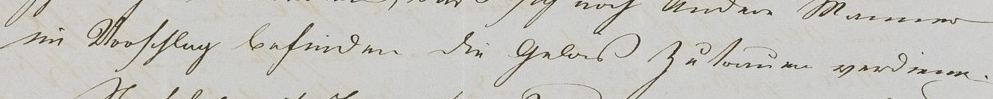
im Vorschlag befinden die gewiß Zutrauen verdienen.
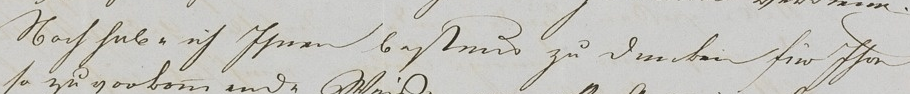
Noch habe ich Ihnen bestens zu danken für Ihre
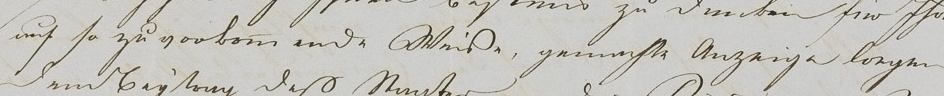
auf so zuvorkommende Weiße, gemachte Anzeige wegen
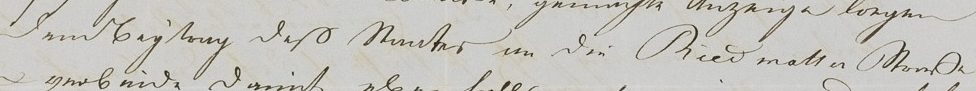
dem Beytrag deß Staates an die Riedmatten Straße
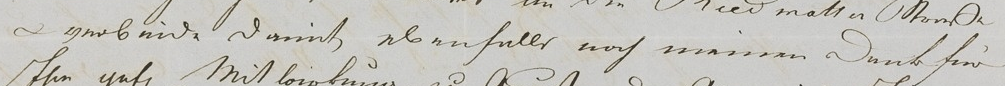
u verbinde damit ebenfalls noch meinen Dank für
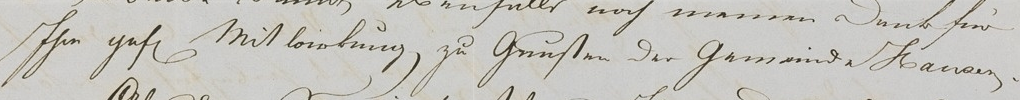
Ihre gef Mitwirkung, zu Gunsten der Gemeinde Hausen.
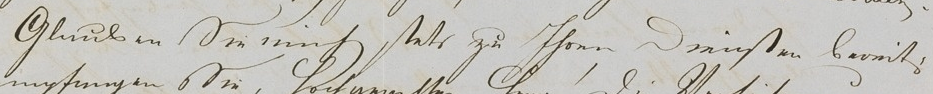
Glauben Sie mich stets zu Ihren Diensten bereit,
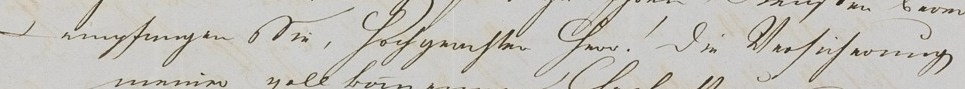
u empfangen Sie, hochgeachter Herr! Die Versicherung
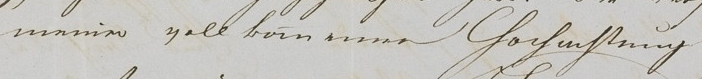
meiner vollkommenen Hochachtung
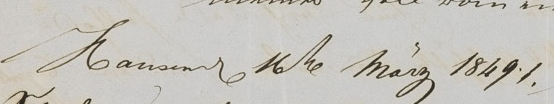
Hausen den16ten März 1849
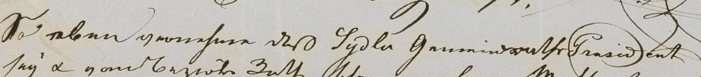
So eben vernehme daß Sydler Gemeinderaths Prasident
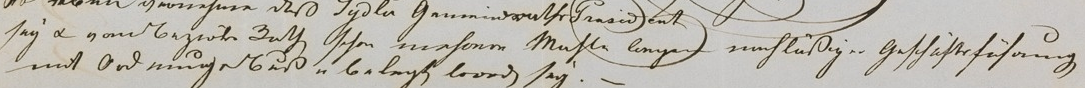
sey u vom Bezirks Rath schon mehrere Mahle wegen nachläßiger Geschäftsführung
